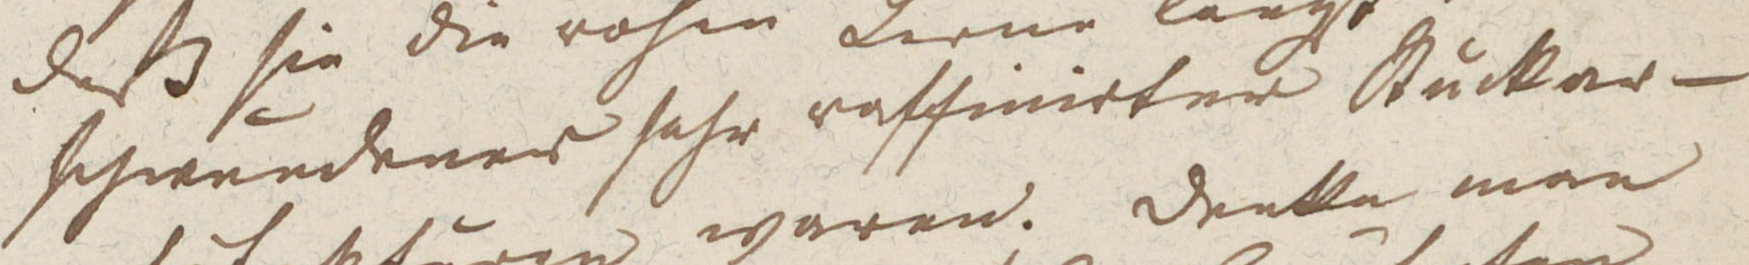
schwundener sehr raffinirter Stuckar-
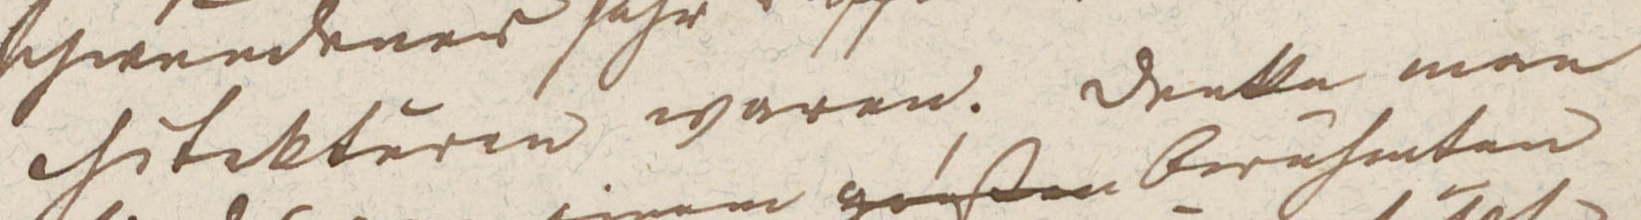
chitekturen waren. Denke man
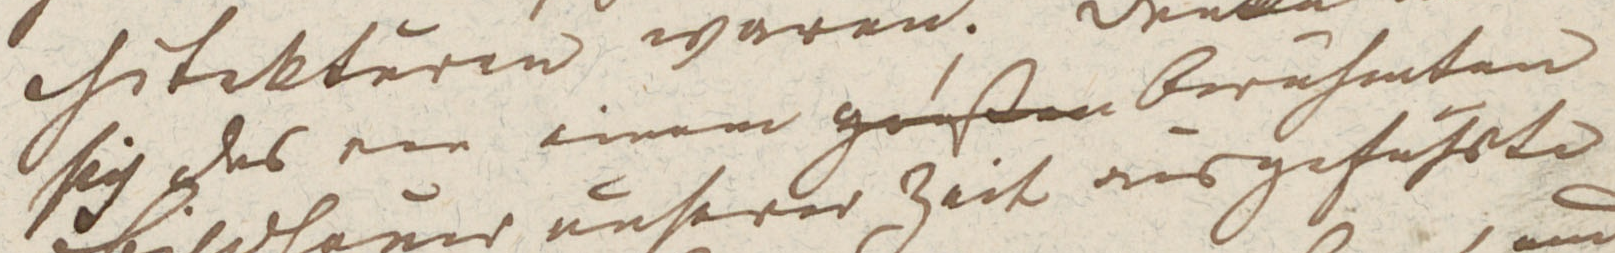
sich das von einem grossen berühmten
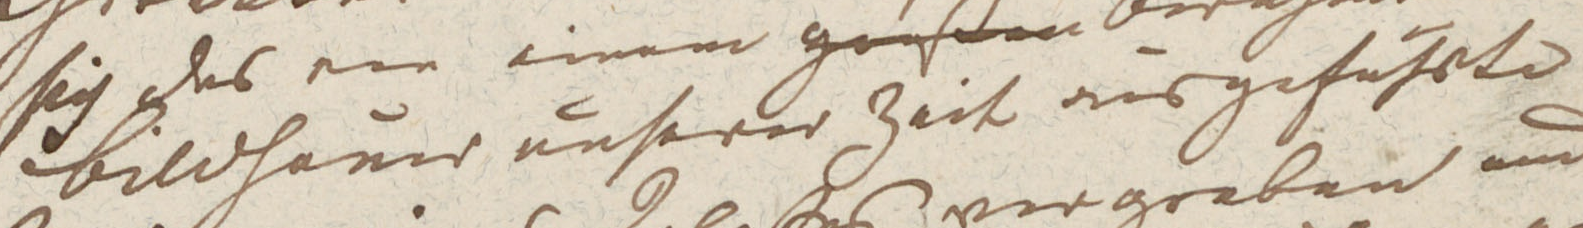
Bildhauer unserer Zeit ausgeführte
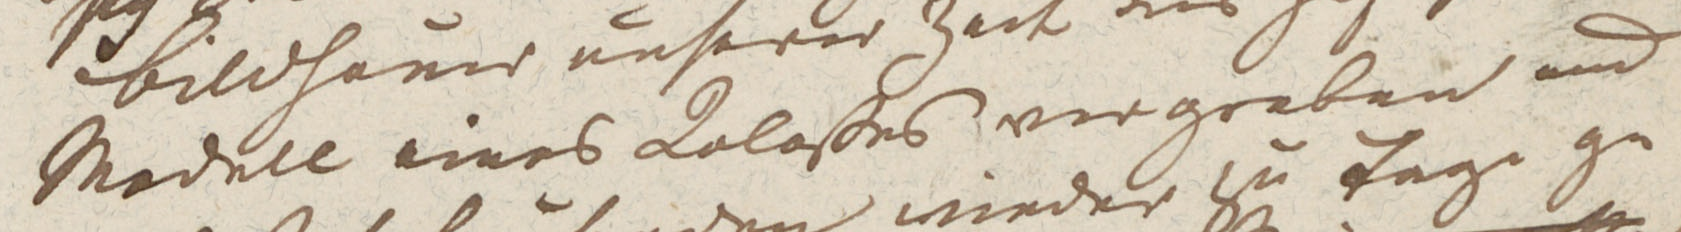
Modell eines Kolosses vergraben und
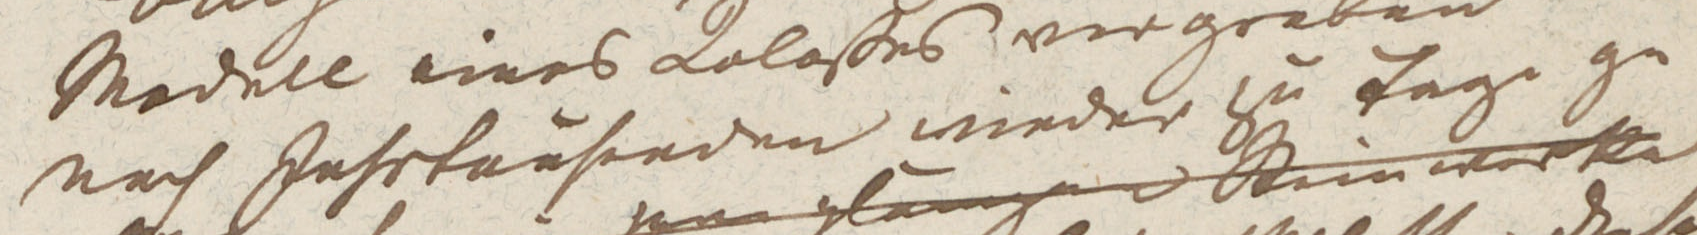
nach Jahrtausenden wieder zu Tage ge
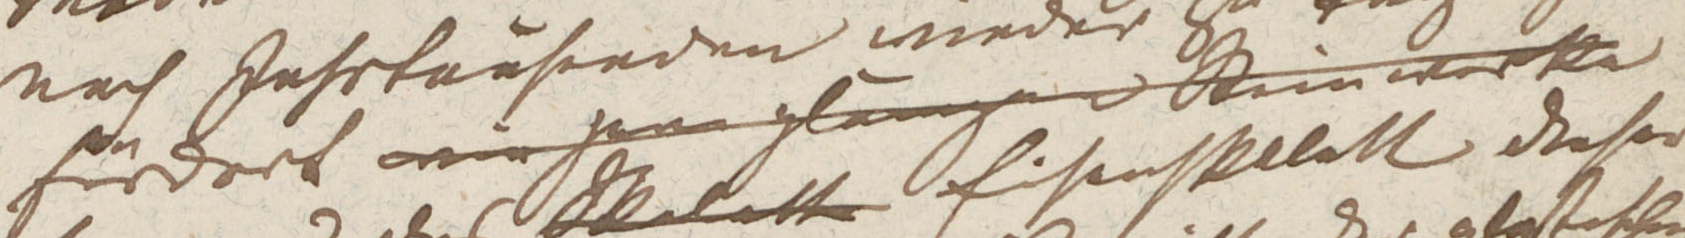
fördert wie jene plumpen Steinwerke
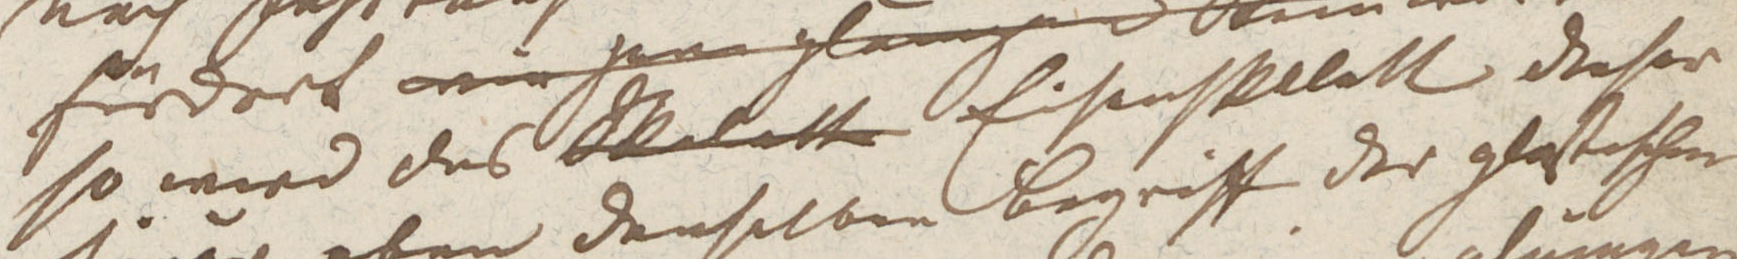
so wird das Skelett Eisenskelett dieser
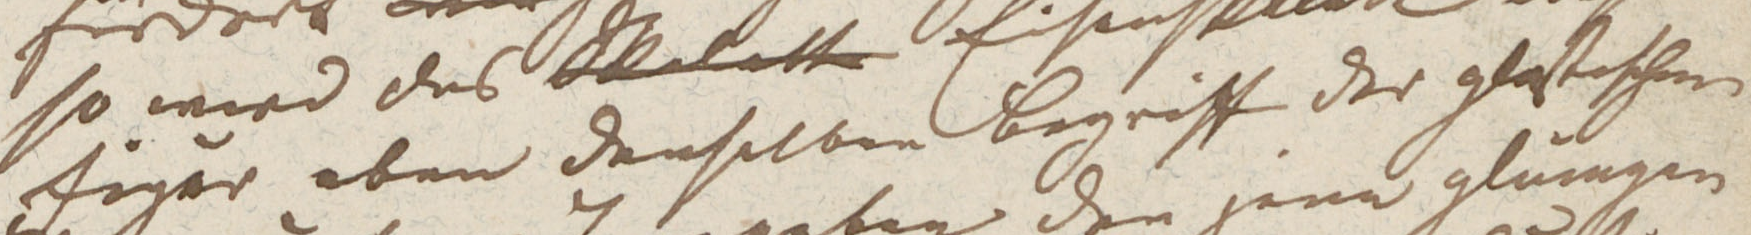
Figur eben denselben Begriff der plastischen
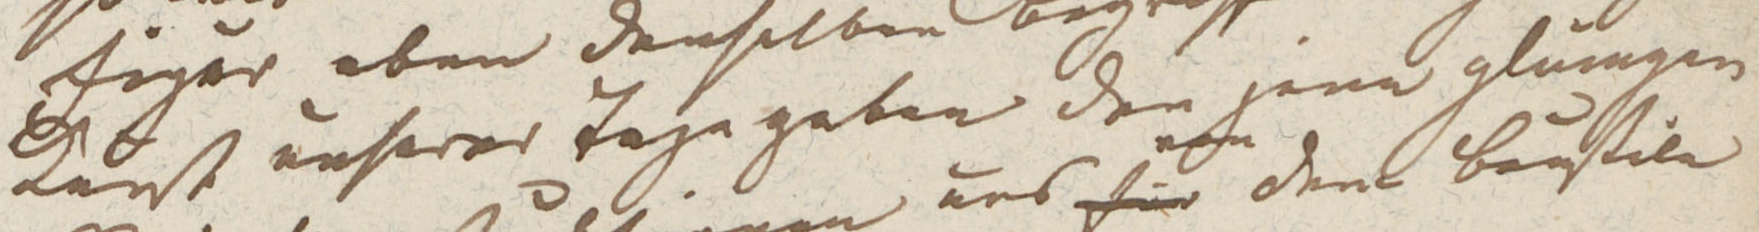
Kunst unserer Tage geben den jene plumpen
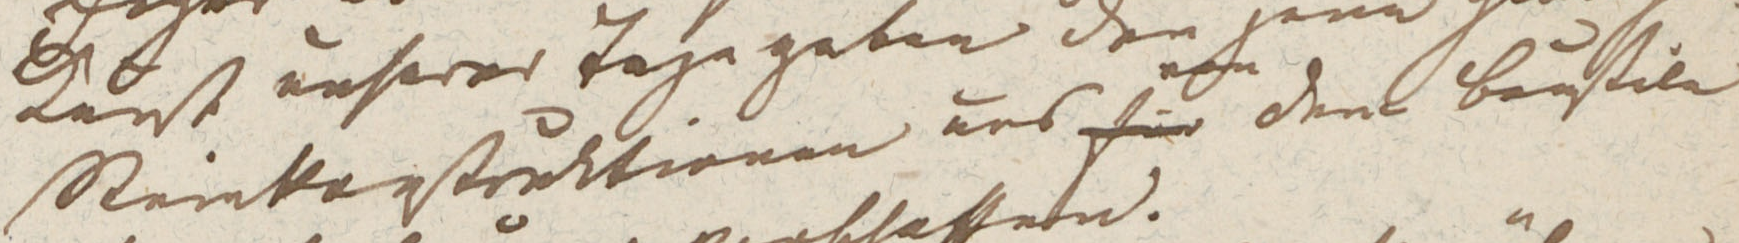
Steinkonstruktionen uns für von dem Baustile
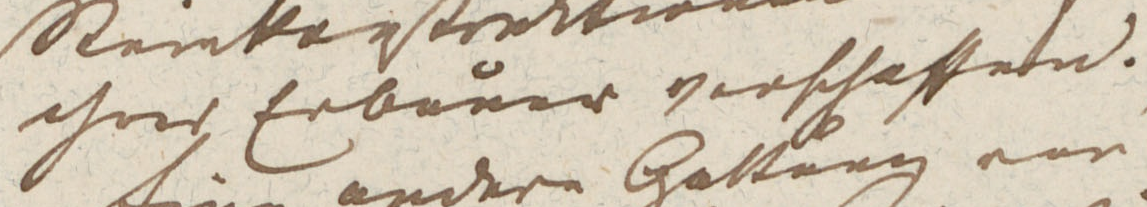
ihrer Erbauer verschaffen.
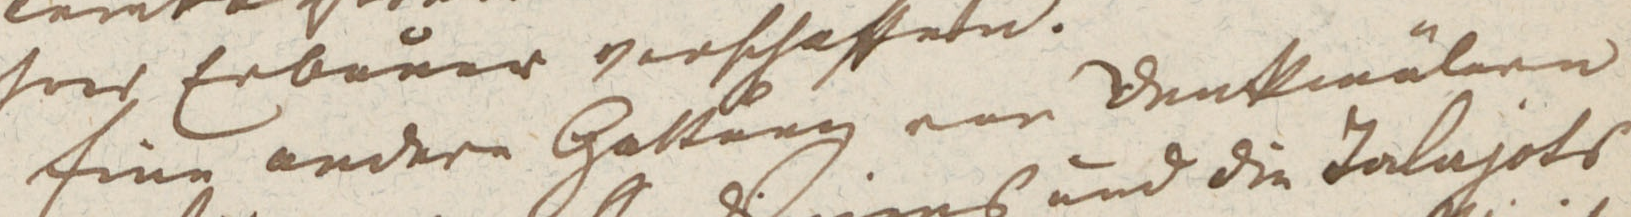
Eine andere Gattung von dDenkmälern
